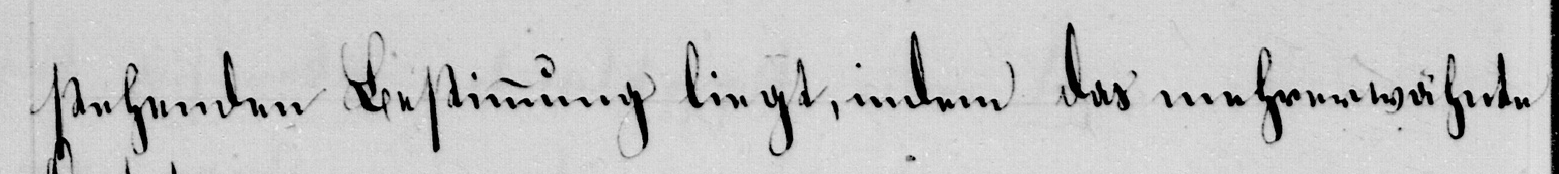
stehenden Bestimmung liegt, indem das mehrerwähnte
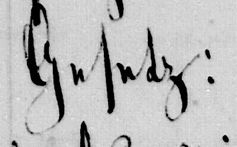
Gesetz:
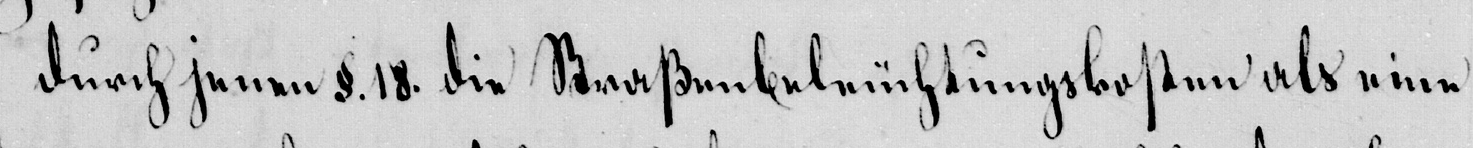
durch jenen §. 18. die Straßenbeleuchtungskosten als eine
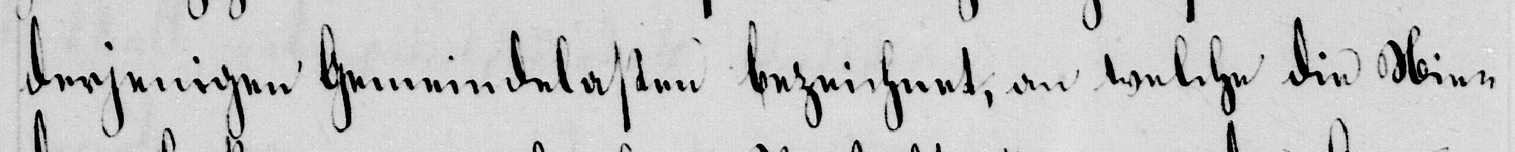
derjenigen Gemeindelasten bezeichnet, an welche die Nie¬
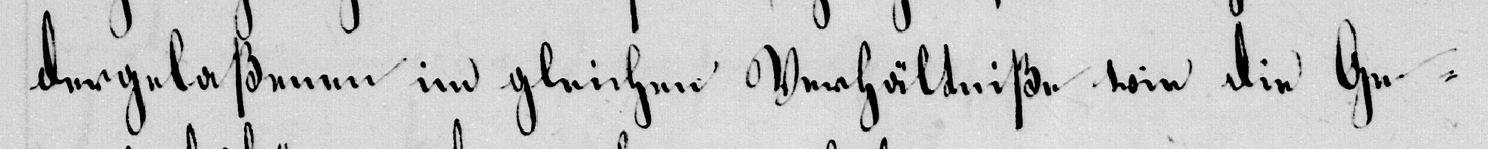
dergelaßenen im gleichen Verhältniße wie die Ge¬
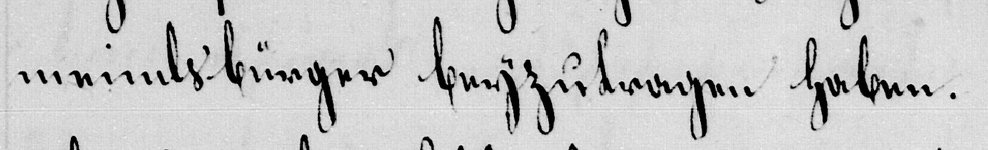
meindsbürger beyzutragen haben.
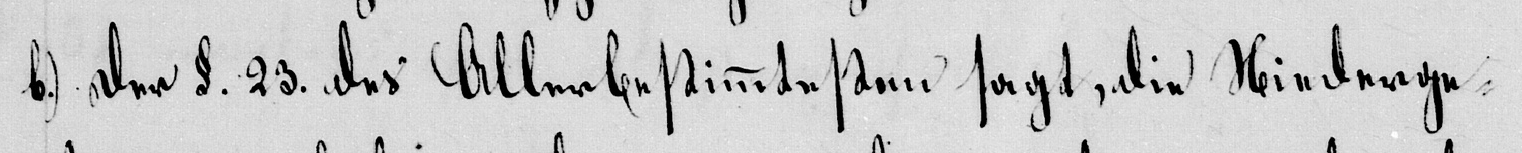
b.) der §. 23. des Allerbestimmtesten sagt, die Niederge¬
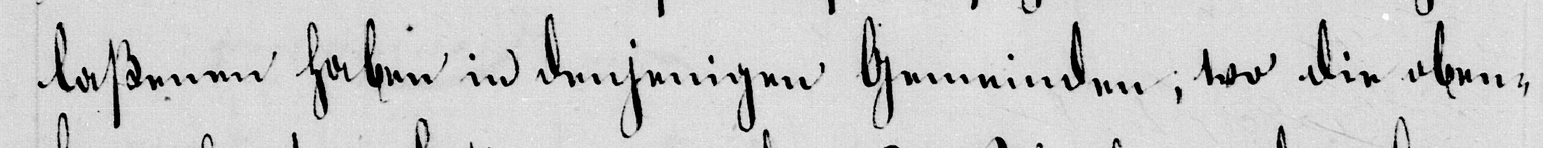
laßenen haben in denjenigen Gemeinden, wo die oben¬
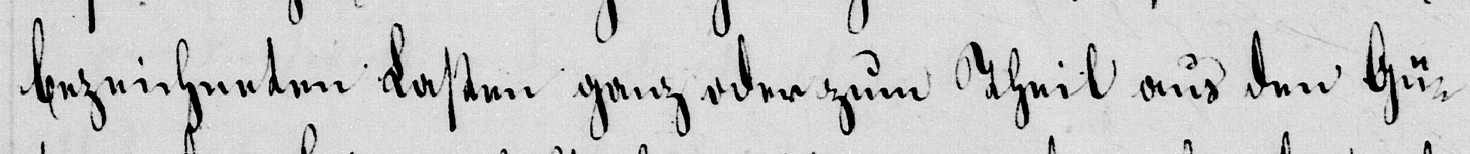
bezeichneten Lasten ganz oder zum Theil aus den Gü¬
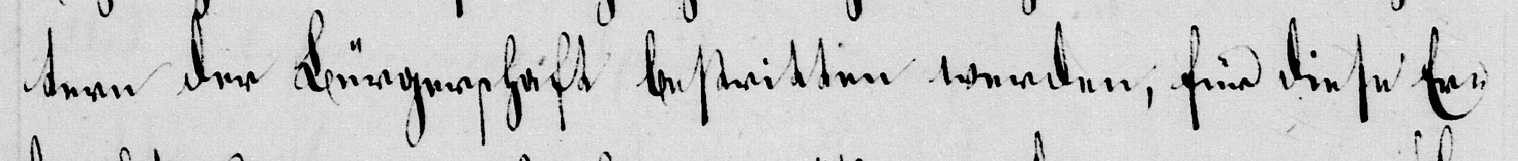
tern der Bürgerschaft bestritten werden, für diese Er¬
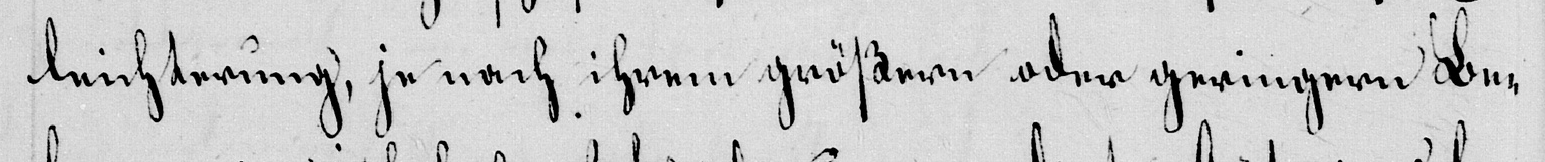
leichterung, je nach ihrem größern oder geringern Be¬
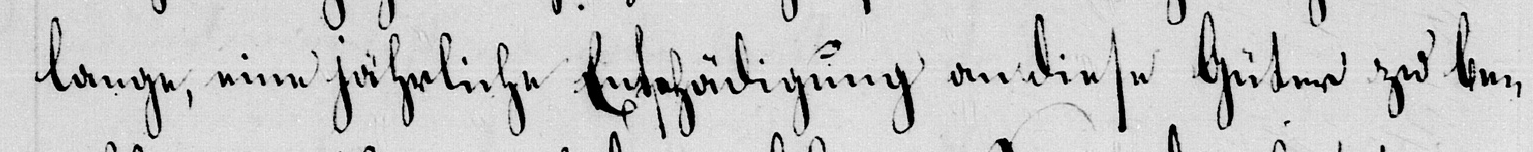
lange, eine jährliche Entschädigung an diese Güter zu be¬
